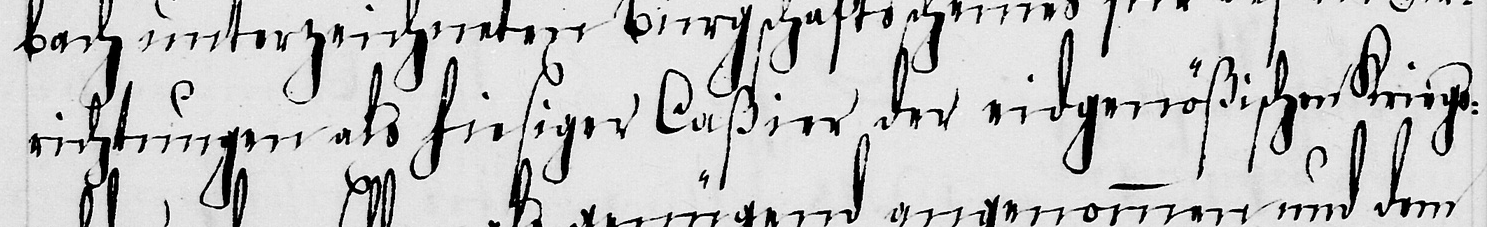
richtungen als hiesiger Caßier der eidgenößischen Krieg¬
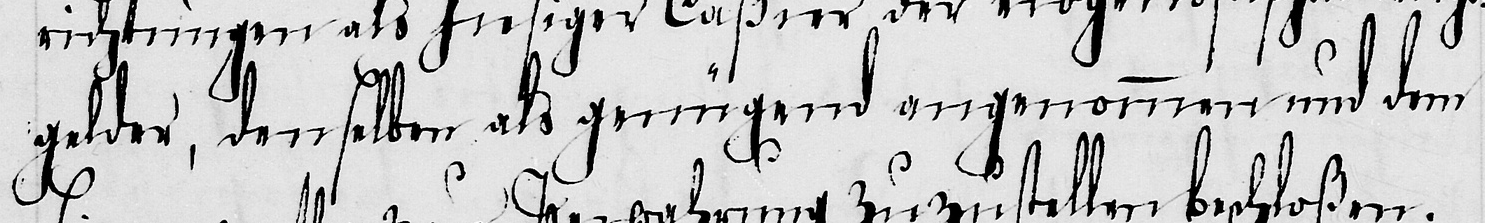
sgelder, denselben als genügend angenommen und dem
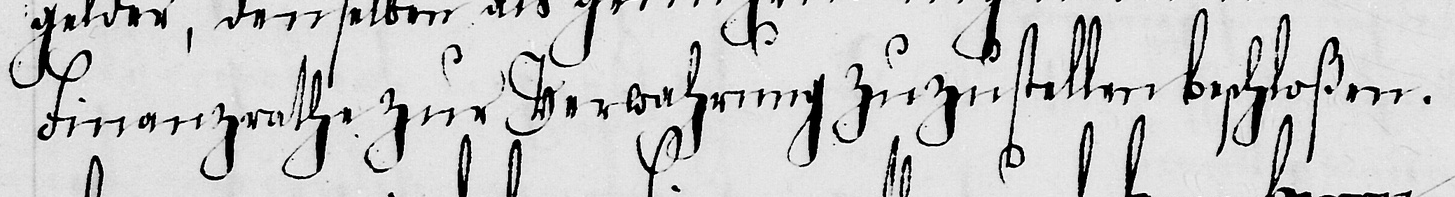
Finanzrathe zur Verwahrung zuzustellen beschloßen.
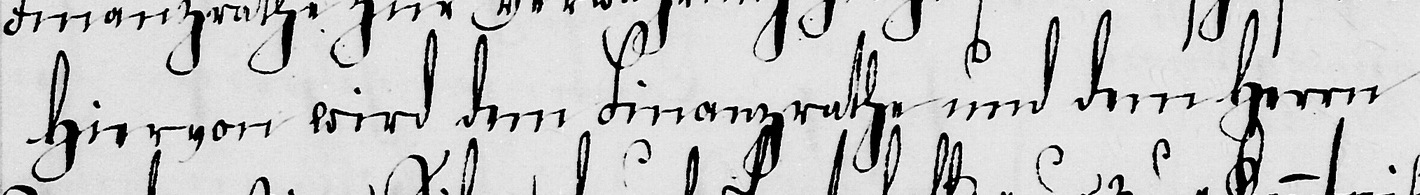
Hiervon wird dem Finanzrathe und dem Herrn
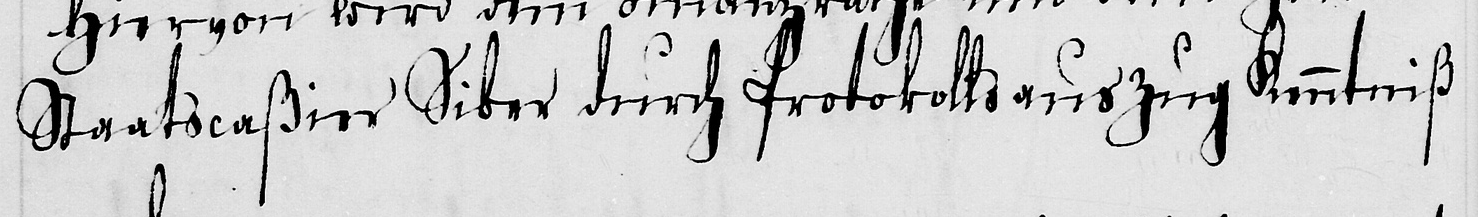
Staatcaßier Siber durch Protokollsauszug Kenntniß
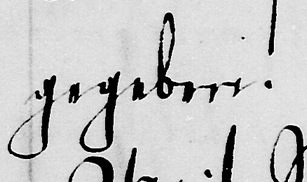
gegeben.
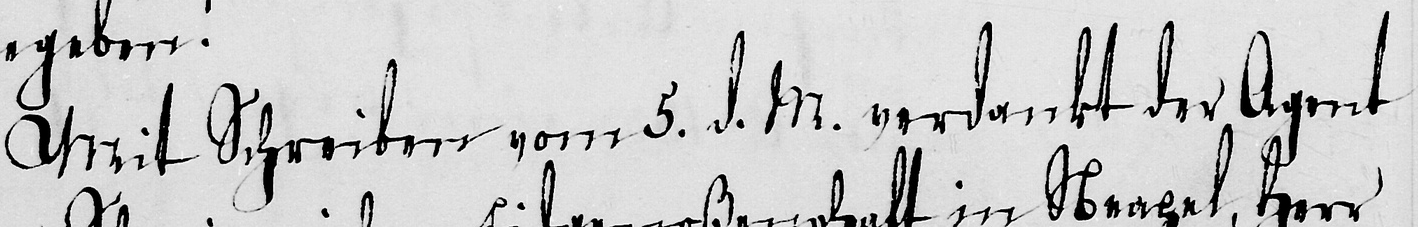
Mit Schreiben vom 5. d. M. verdankt der Agent
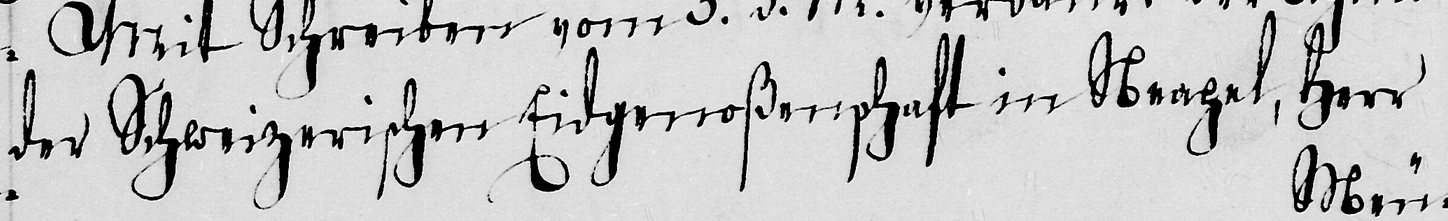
der Schweizerischen Eidgenoßenschaft in Neapel, Herr
